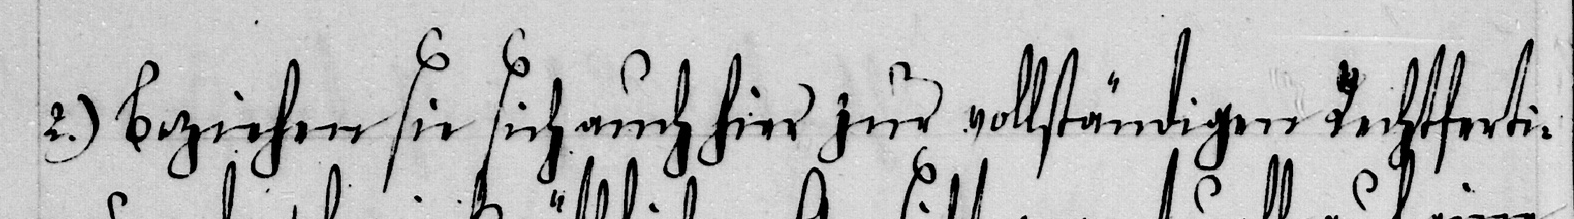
2.) beziehen sie sich auch hier zur vollständigen Rechtfer¬
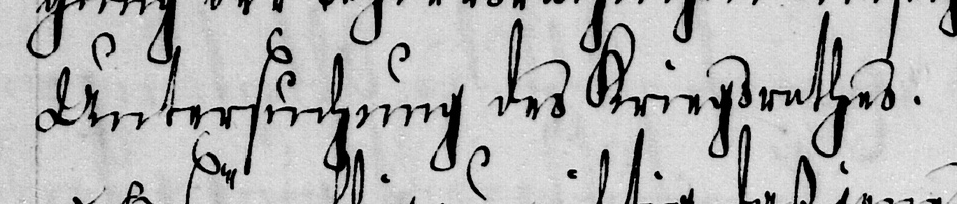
Untersuchung des Kriegsrathes.
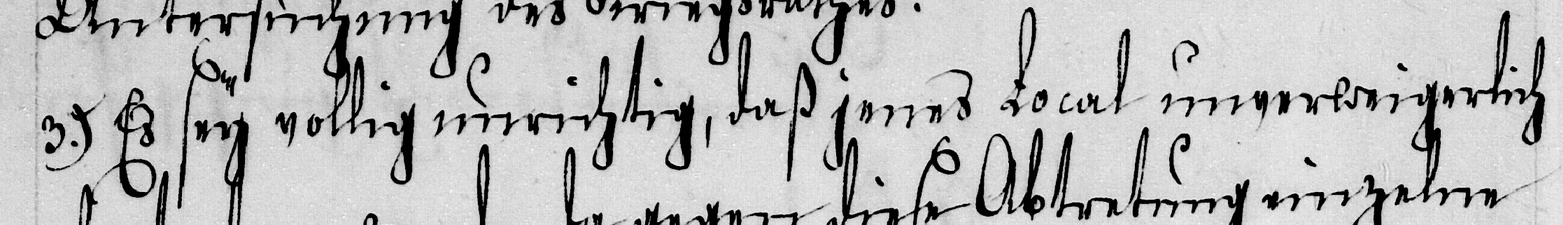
3.) Es sey vollig unrichtig, daß jenes Local unverweigerlich
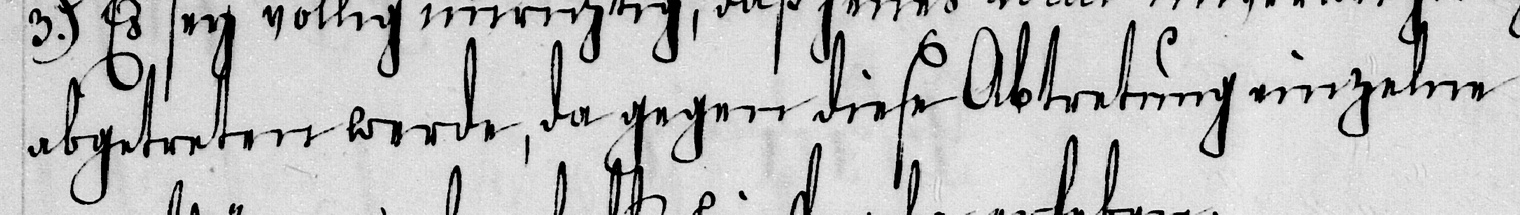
abgetreten werde, da gegen diese Abtretung einzelne
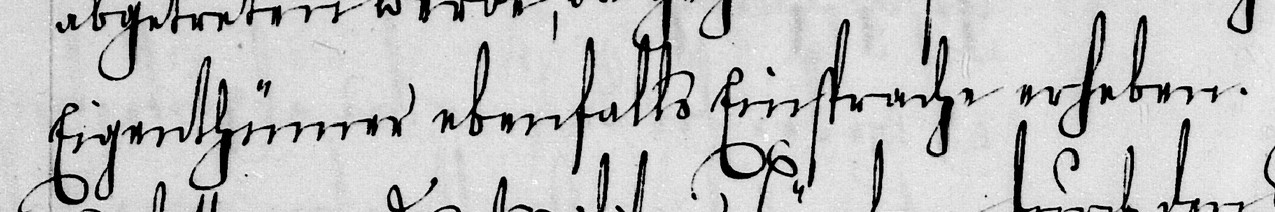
Eigenthümer ebenfalls Einsprache erheben.
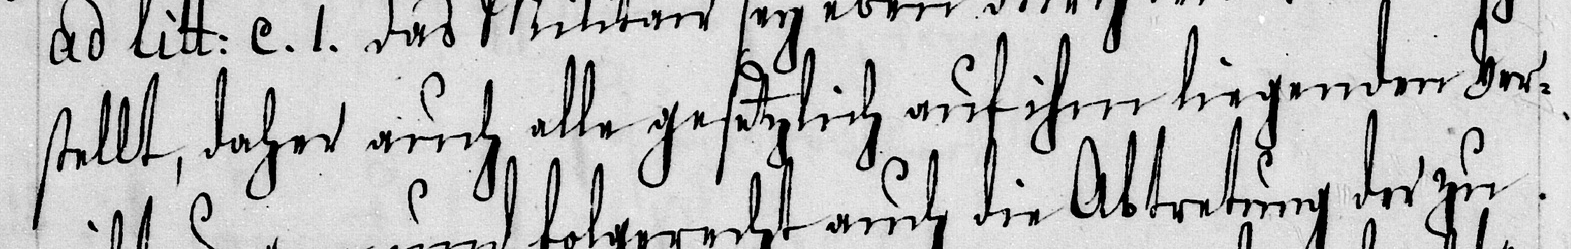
stellt, daher auch alle gesetzlich auf ihm liegenden Ver¬
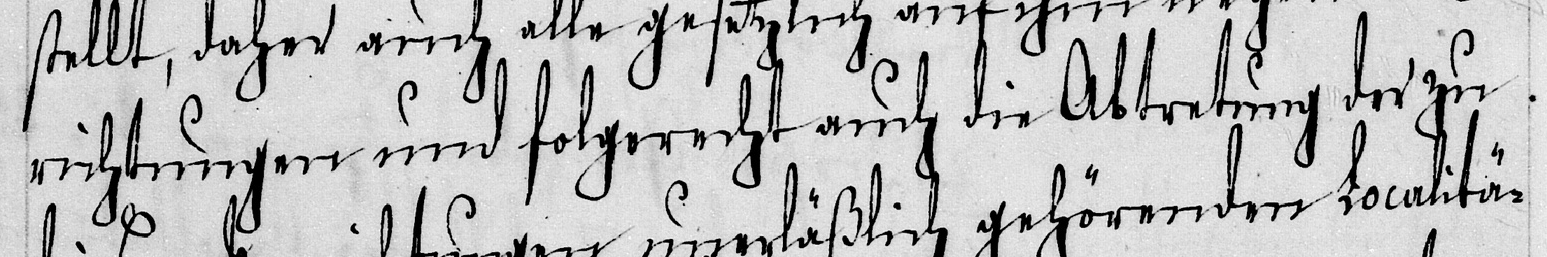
richtungen und folgerecht auch die Abtretung der zu
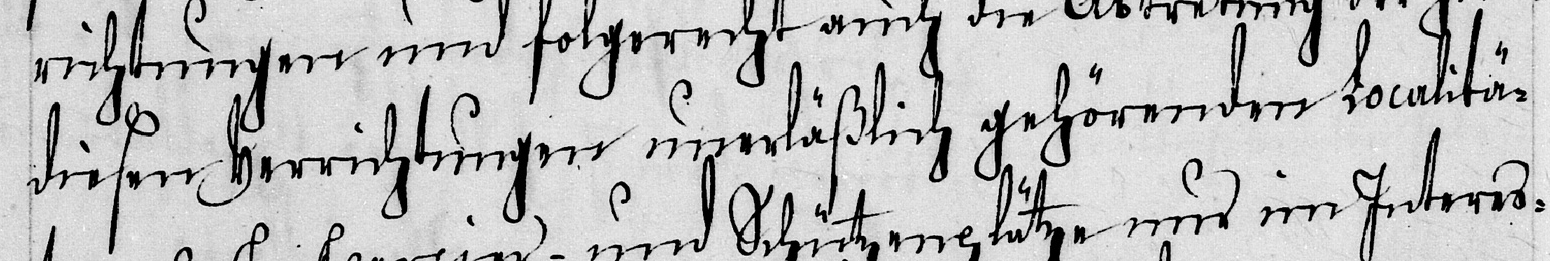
diesen Verrichtungen unerläßlich gehörenden Localitä¬
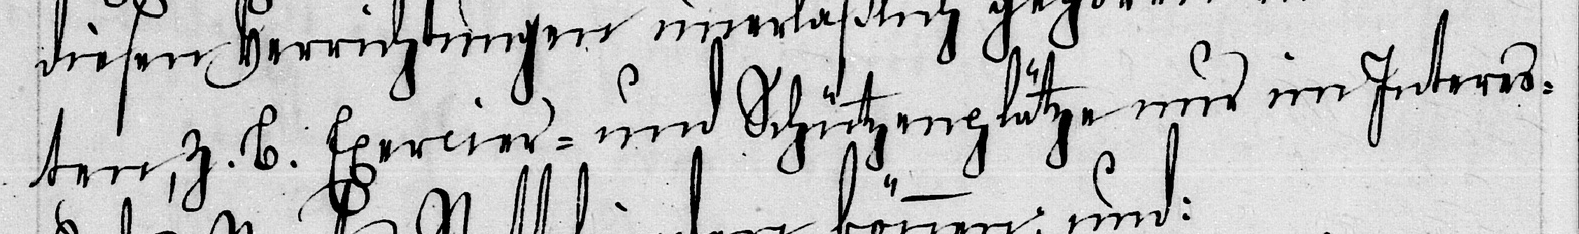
ten, z.B. Exercier- und Schützenplätze nur im Intere¬
